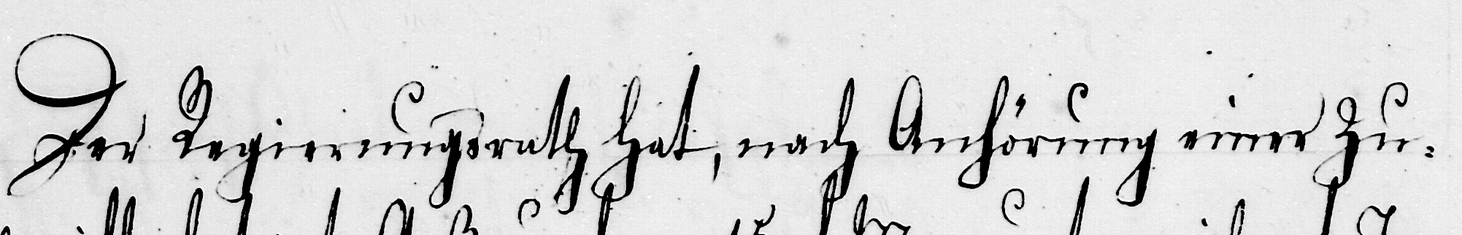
Der Regierungsrath hat, nach Anhörung einer Zu¬
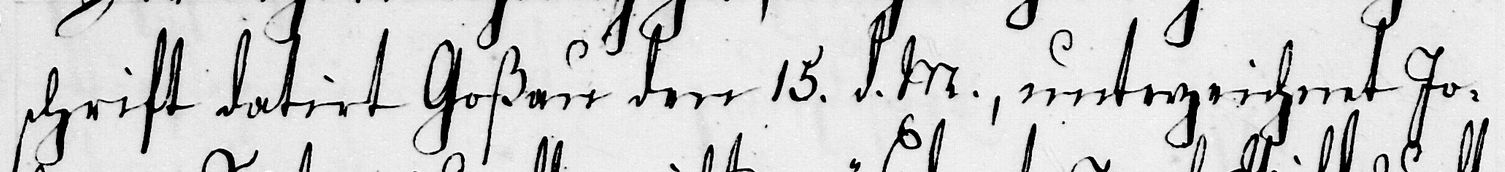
schrift datirt Goßau den 15. d. M., unterzeichnet Jo¬
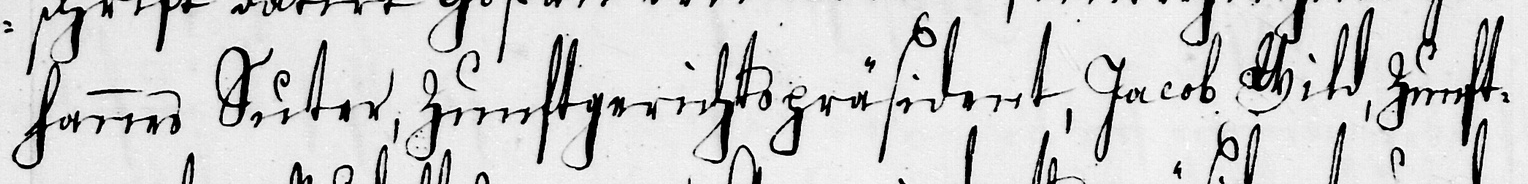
hannes Suter, Zunftgerichtspräsident, Jacob Wild, Zunft¬
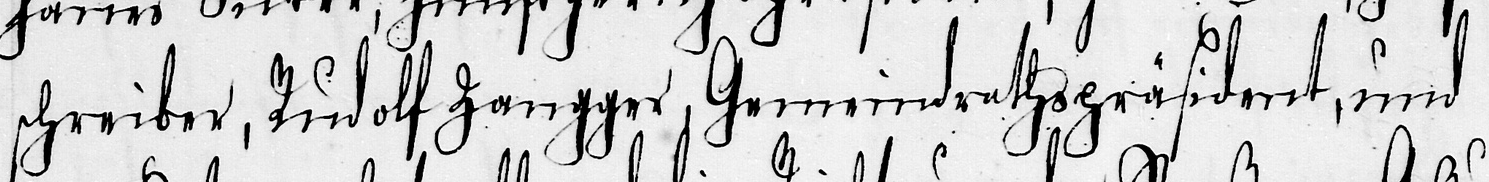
schreiber, Rudolf Zangger, Gemeindrathspräsident, und
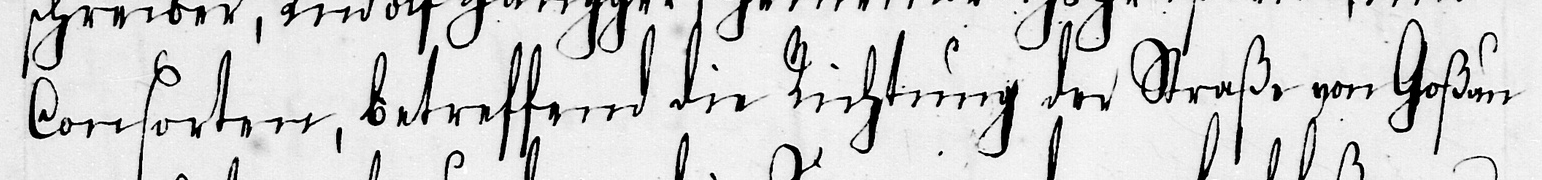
Consorten, betreffend die Richtung der Straße von Goßau
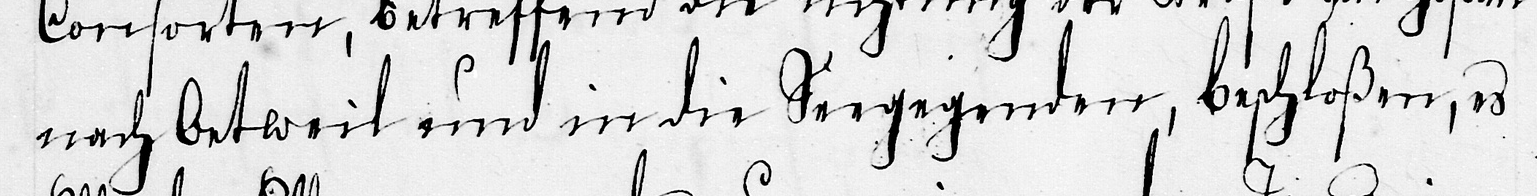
nach Oetweil und in die Seegegenden, beschloßen, es
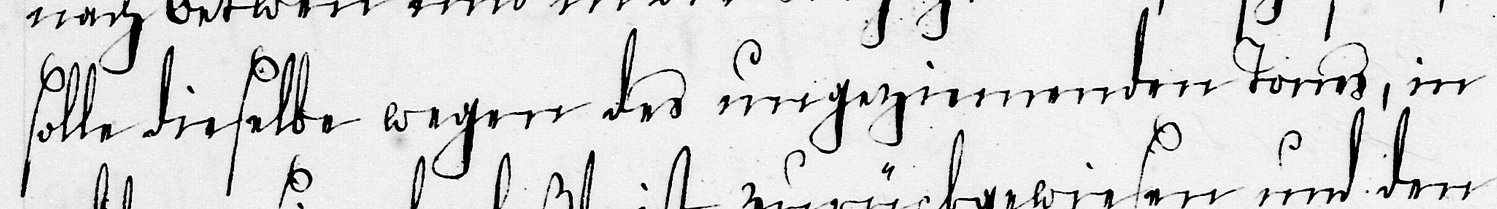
solle dieselbe wegen des ungeziemenden Tones, in
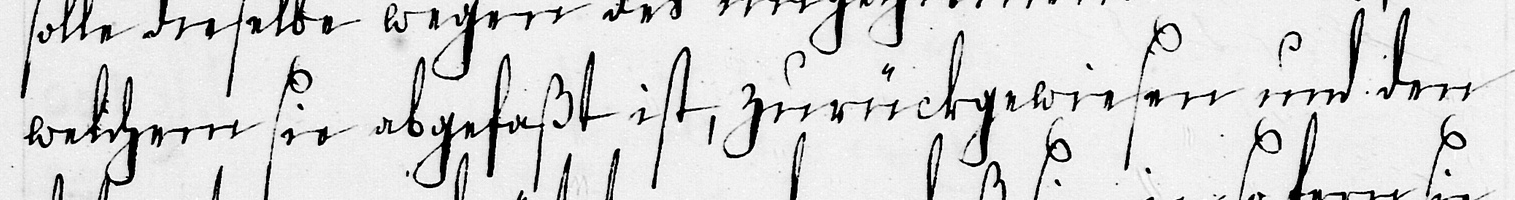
welchem sie abgefaßt ist, zurückgewiesen und den
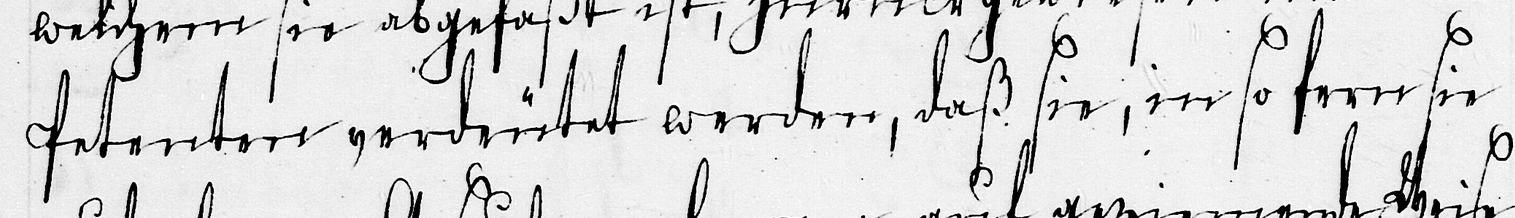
Petenten verdeutet werden, daß sie, in so fern sie
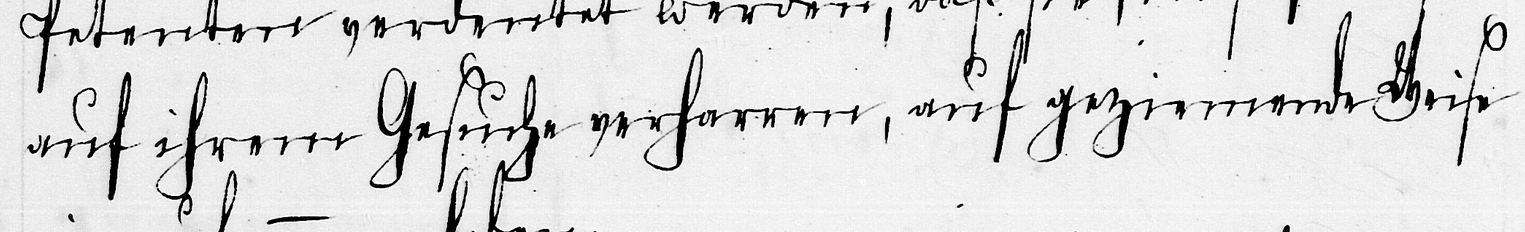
auf ihrem Gesuche verharren, auf geziemende Weise
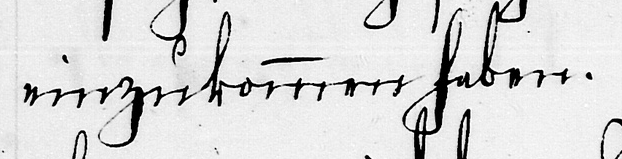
einzukommen haben.
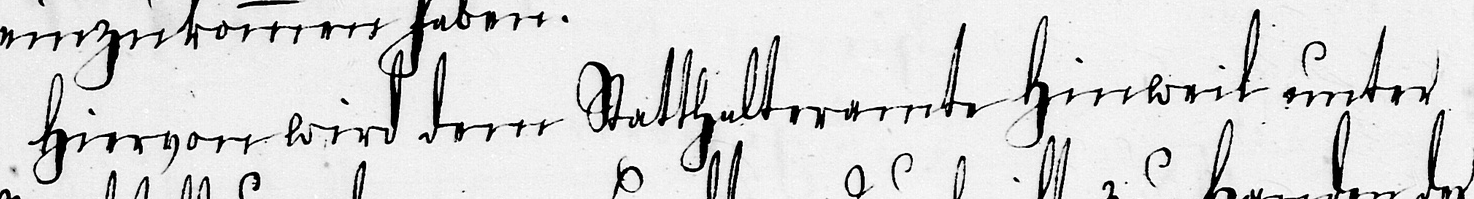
Hiervon wird dem Statthalteramte Hinweil unter
